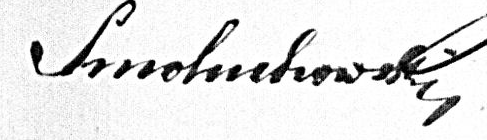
Smolnetwek
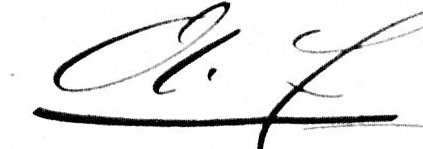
A.E
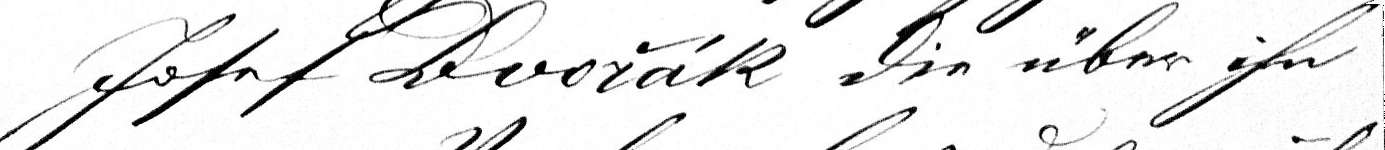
Josef Dvořák die über ihn
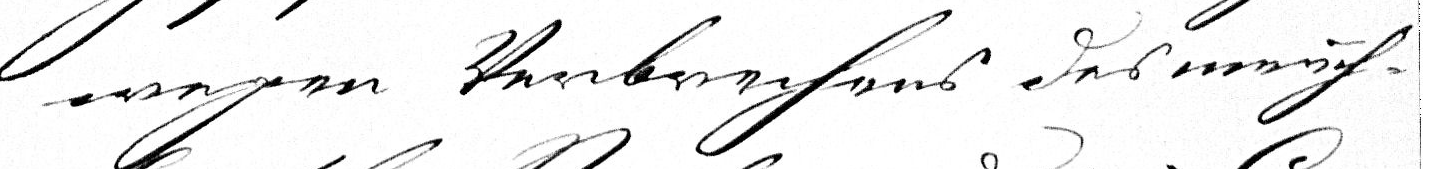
wegen Verbrechens des meuch¬
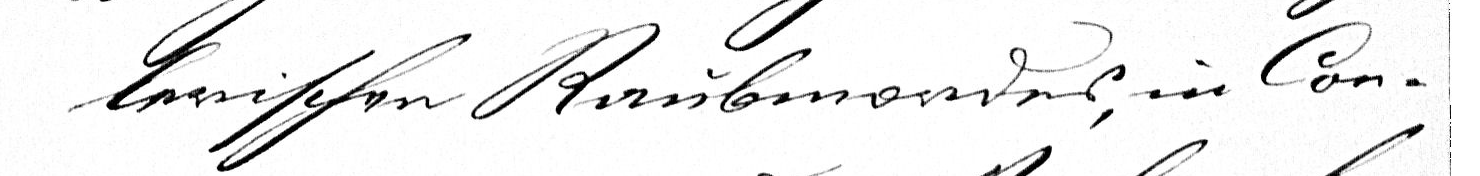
lerischen Raubmordes, in Con¬
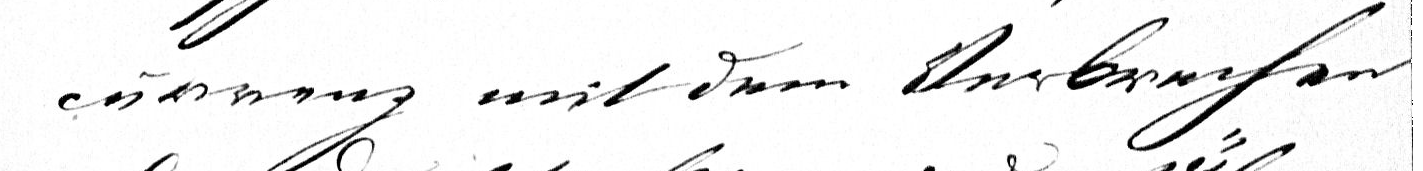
currenz mit dem Verbrechen
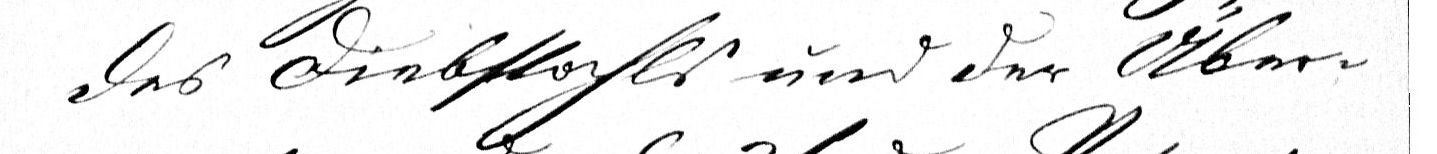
des Diebstahls und der Über¬
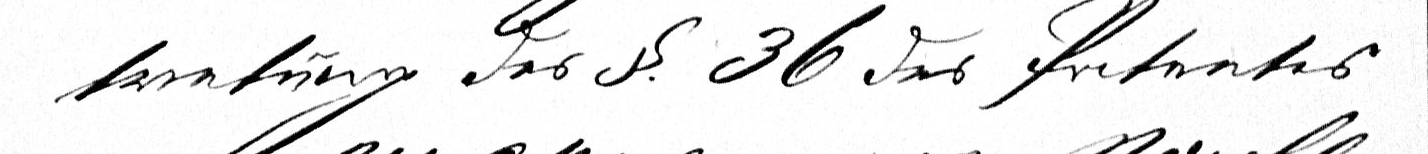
tretung des §. 36 des Potentes
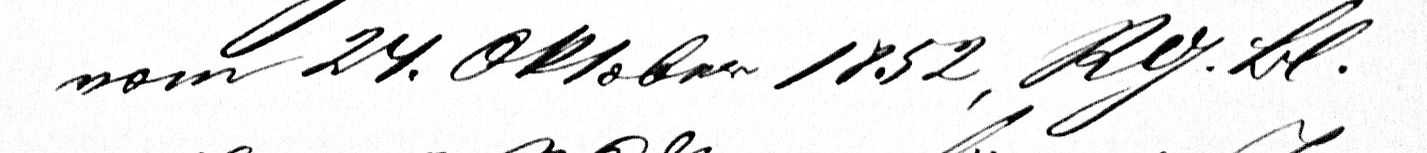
vom 24. Oktober 1852, Rg. Bl.
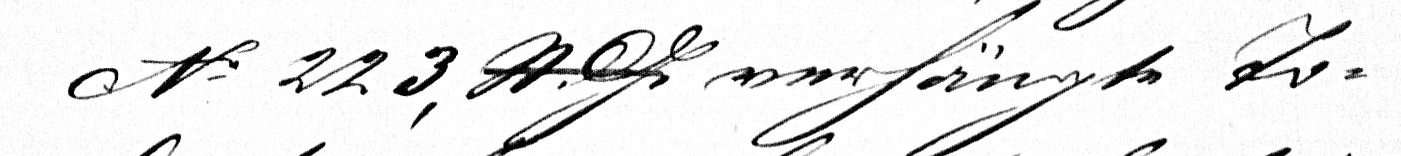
N° 223, verhängte To¬
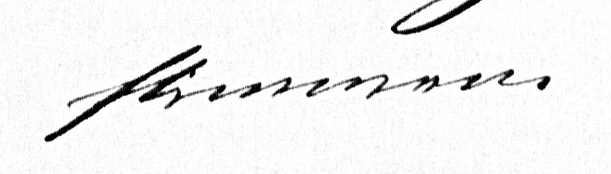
stimmen.
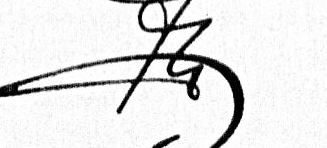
xx
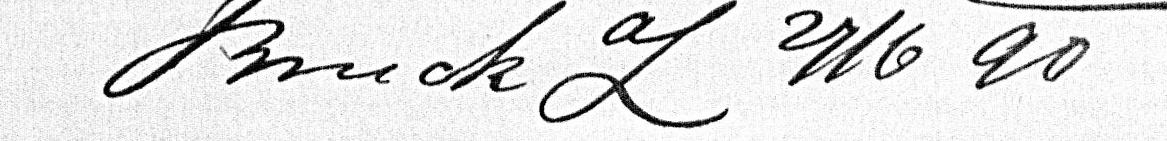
Bruck L 9/6 90
